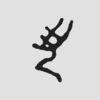兄
